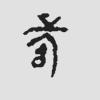辥
